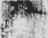八
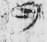月
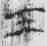壬
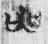申
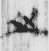之
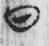日
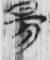昜（陽）
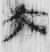大
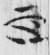正
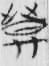登
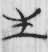生
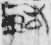○（雄）
